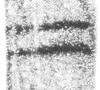二
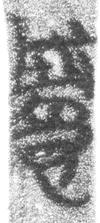○（盛）
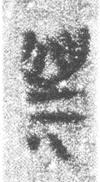○（箕）
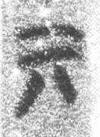亓（其）
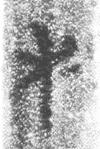木
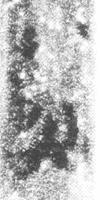器
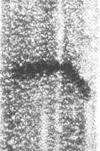一
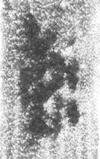厀（漆）
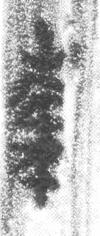橐
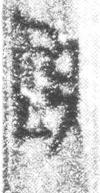鈇（鋪）
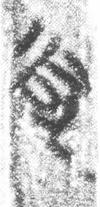首
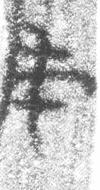屯
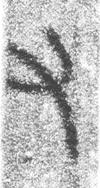又（有）
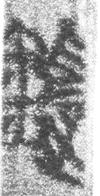鐶（環）
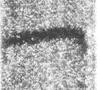一
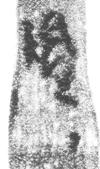○（橛）
